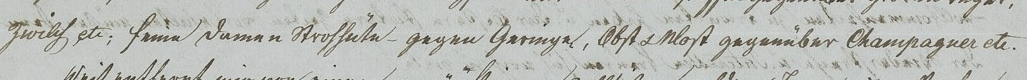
Zwilch etc ; feine Damen Strohhüte – gegen Geringe, Obst & Most gegenüber Champagner etc.
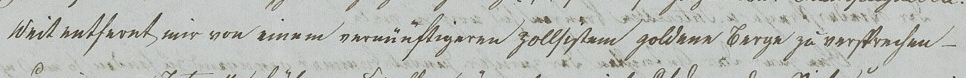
Weit entfernt mir von einem vernünftigeren Zollsistem goldene Berge zu versprechen –
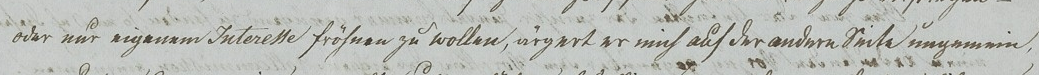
oder nur eigenem Interesse fröhnen zu wollen, ärgert es mich auf der andern Seite ungemein,
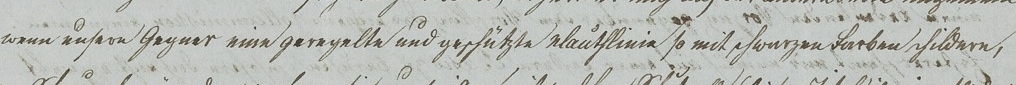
wenn unsere Gegner eine geregelte und geschützte Mauthlinie so mit schwarzen Farben schildern,
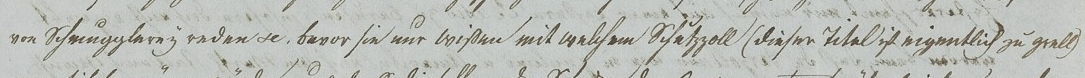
von Schmugglerey reden &c, bevor sie nur wissen mit welchem Schutzzoll (dieser Titel ist eigentlich zu grell)
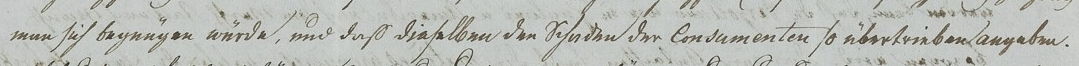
man sich begnügen würde, und daß dieselben den Schaden der Consumenten so übertrieben angeben.
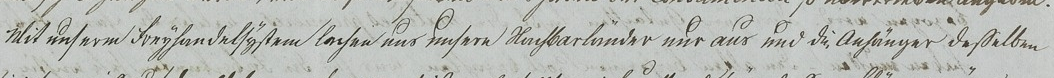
Mit unserm Freyhandelsystem lachen uns unsere Nachbarländer nur aus und die Anhänger desselben
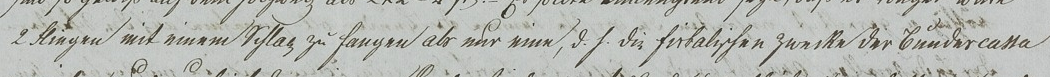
2 Fliegen mit einem Schlag zu fangen als nur eine, d. h. die fiskalischen Zwecke der Bundescassa
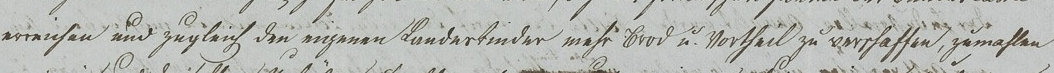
erreichen und zugleich den eigenen Landeskinder mehr Brod u. Vortheil zu verschaffen, zumahlen
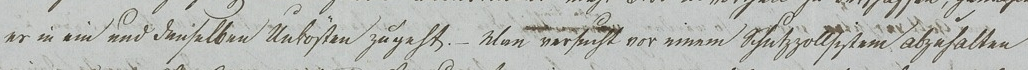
es in ein und denselben Unkösten zugeht. – Man versucht vor einem Schutzzollsistem abzuhalten
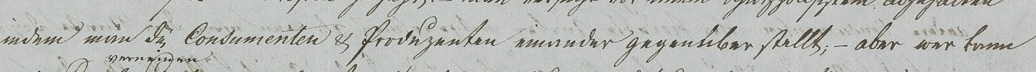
indem man die Consumenten & Produzenten einander gegenüber stellt; – aber wer kann
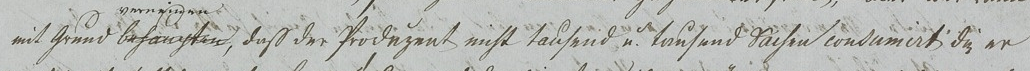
mit Grund behauptenverneinen, daß der Produzent nicht tausend u. tausend Sachen consumirt die er
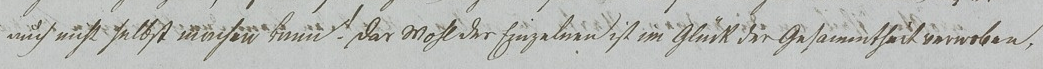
auch nicht selbst machen kann! Das Wohl des Einzelnen ist im Glück der Gesammtheit verwoben,
